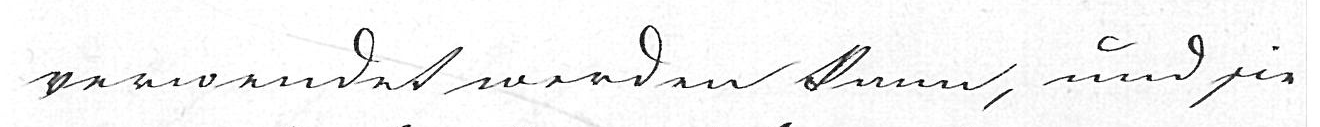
verwendet werden kann, und sie
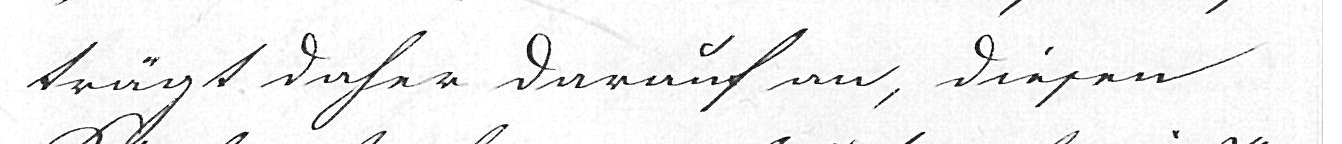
trägt daher darauf an, diesen
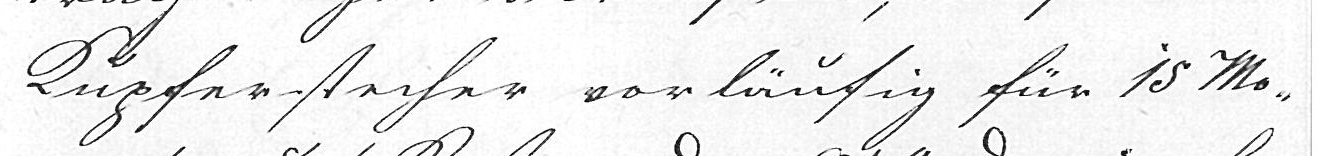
Kupferstecher vorläufig für 15 Mo-
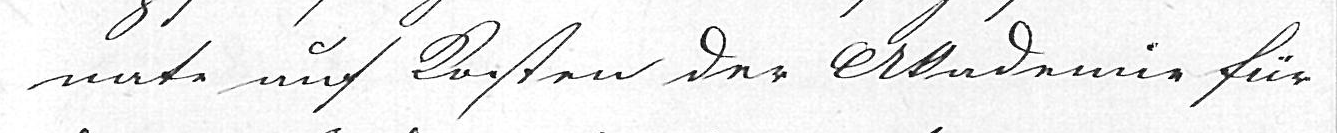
nate auf Kosten der Akademie für
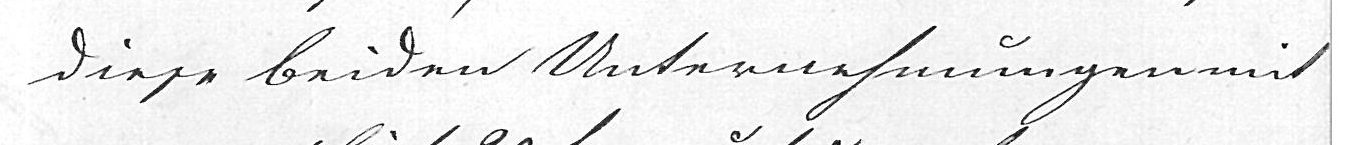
diese beiden Unternehnungen mit
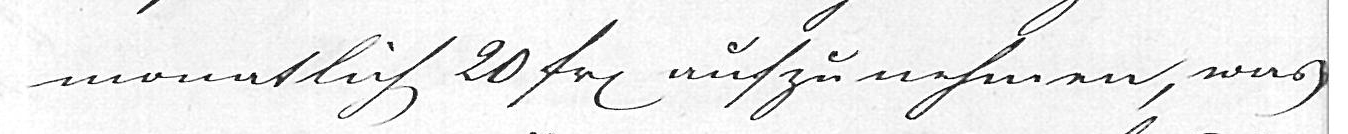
monatlich 20 fl, aufzunehmen, was
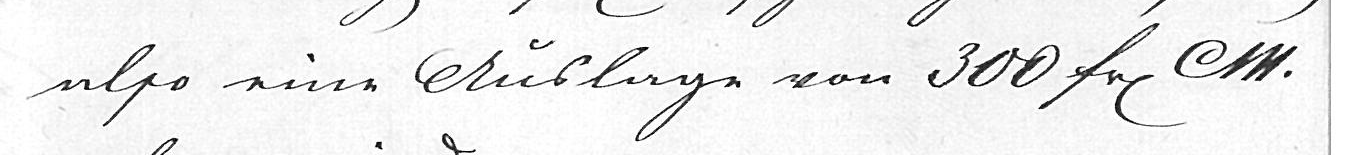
also eine Auslage von 300 fl CM
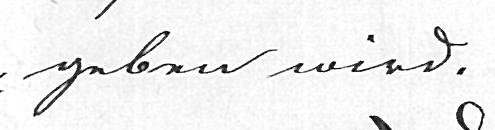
geben wird.
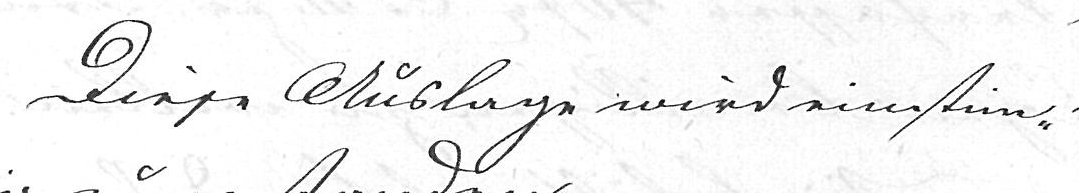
Die Auslage wird einstim-
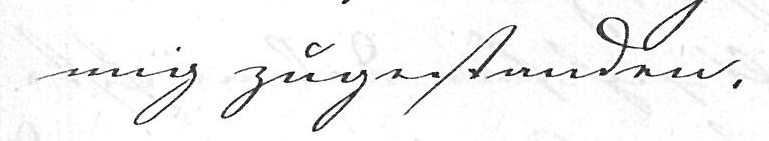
mig zugestanden.
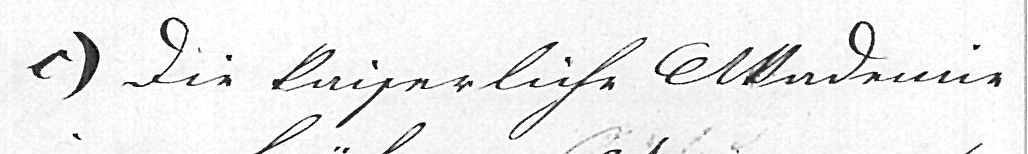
c) Die kaiserliche Akademie
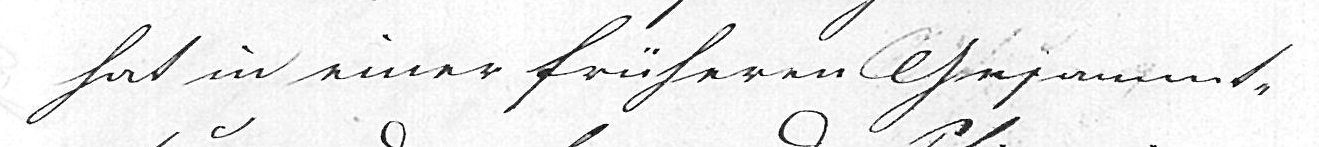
hat in einer früheren Gesammt-
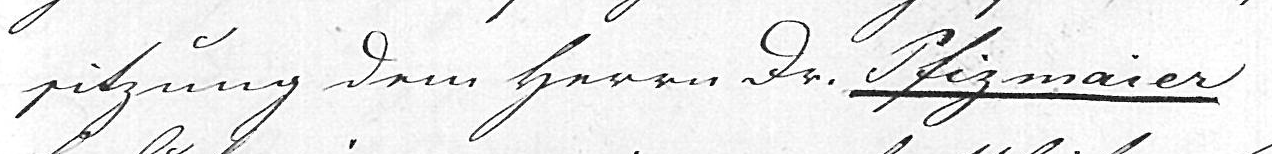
sitzung dem Herrn Dr. Pfizmaier
